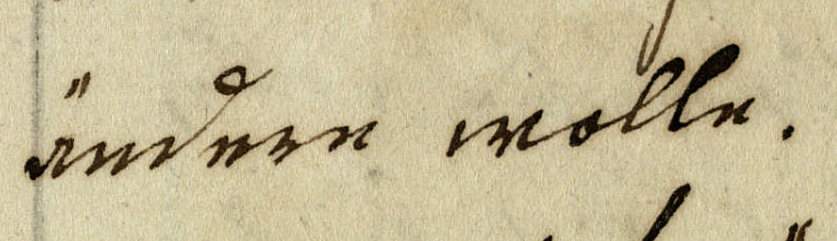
ändern wolle.
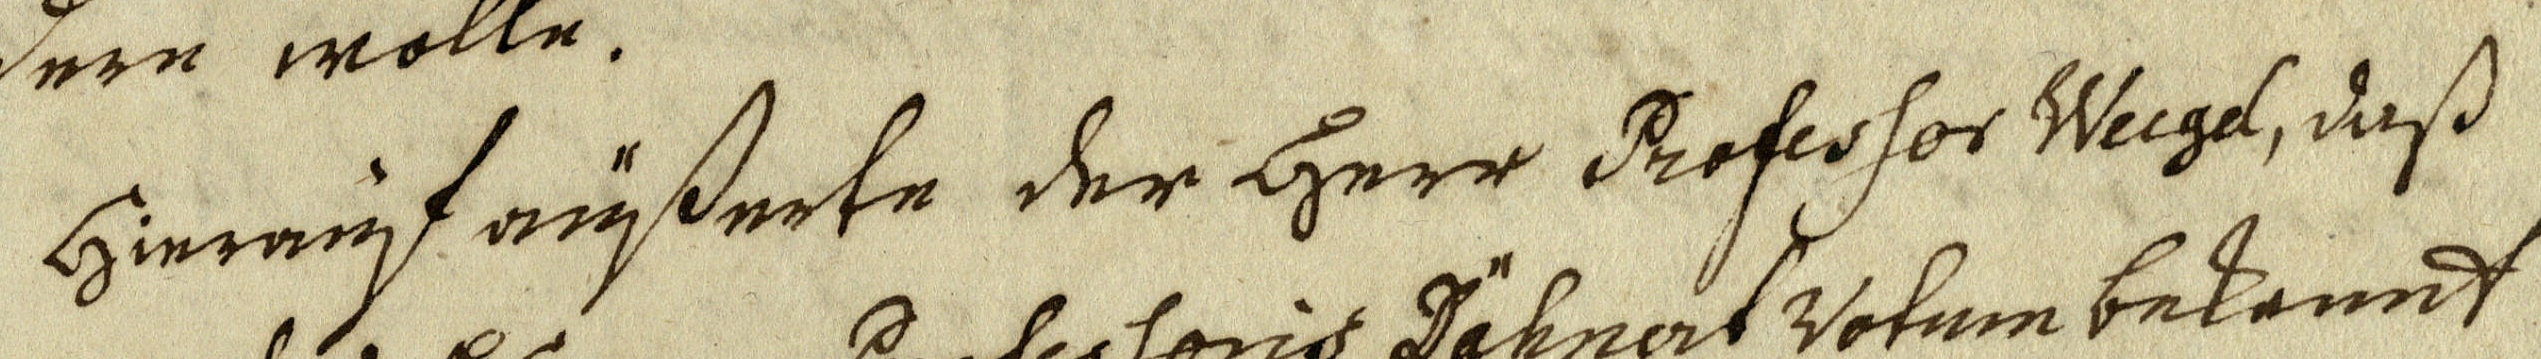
Hierauf äußerte der Herr Professor Weigel, daß
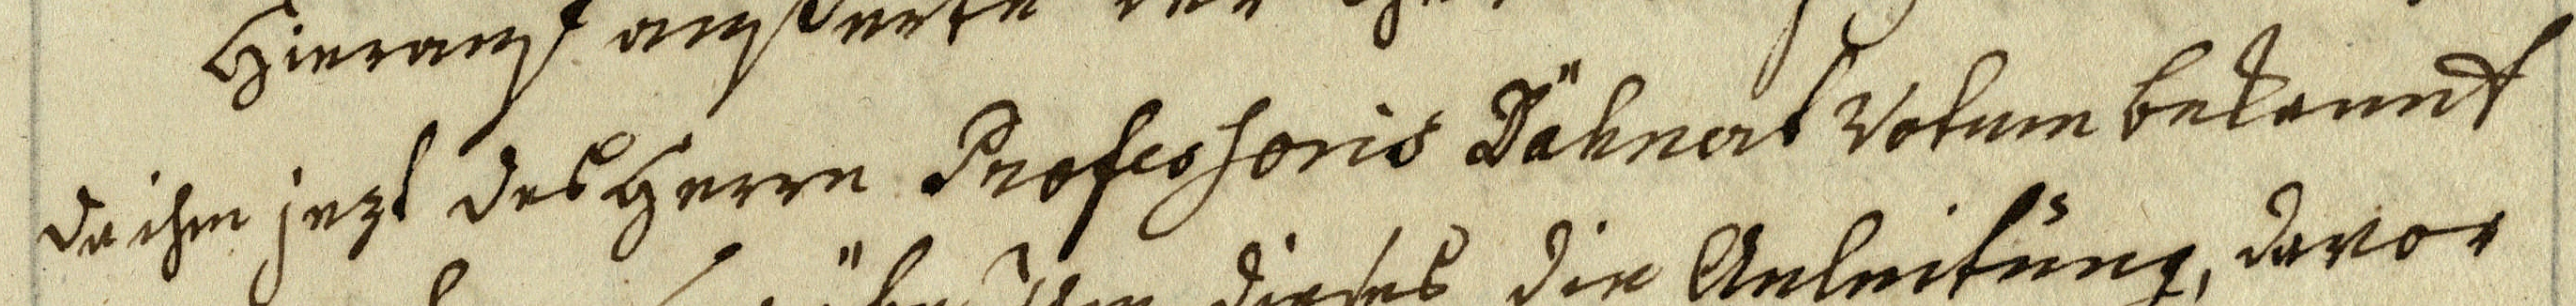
da ihm jezt des Herrn Professoris Dähnert Votum bekannt
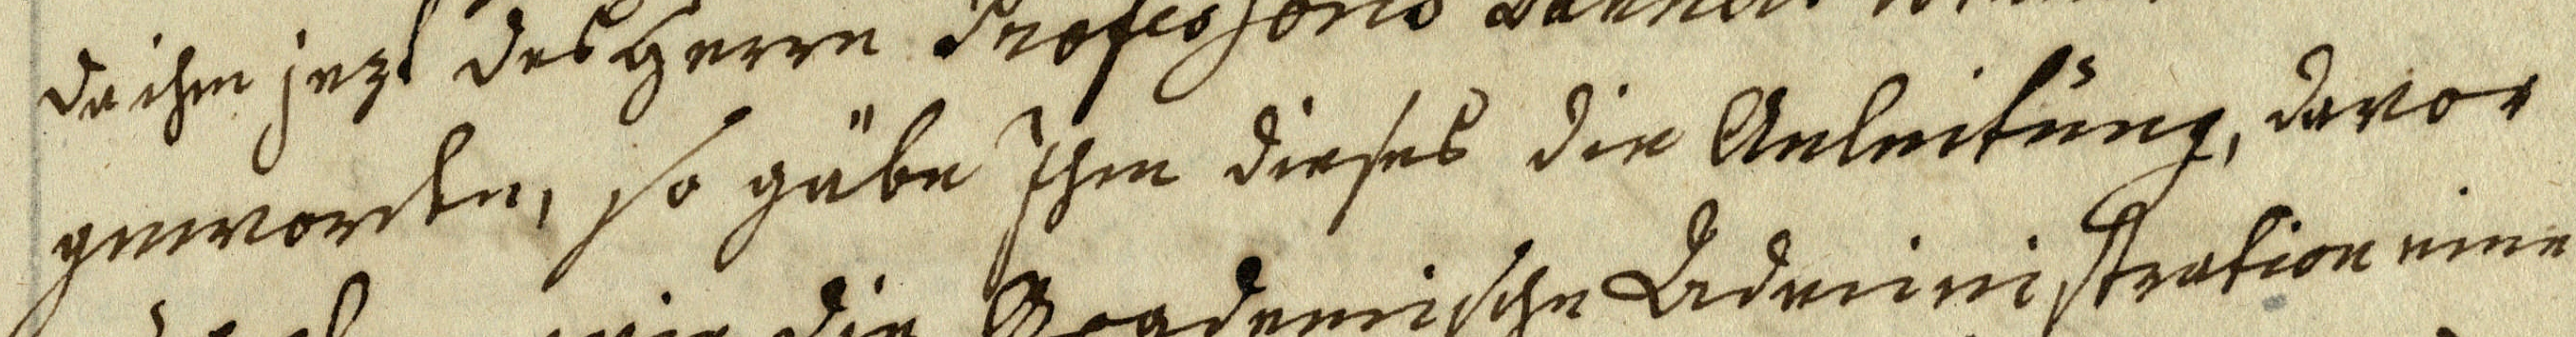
geworden, so gäbe Ihm dieses die Anleitung, davor
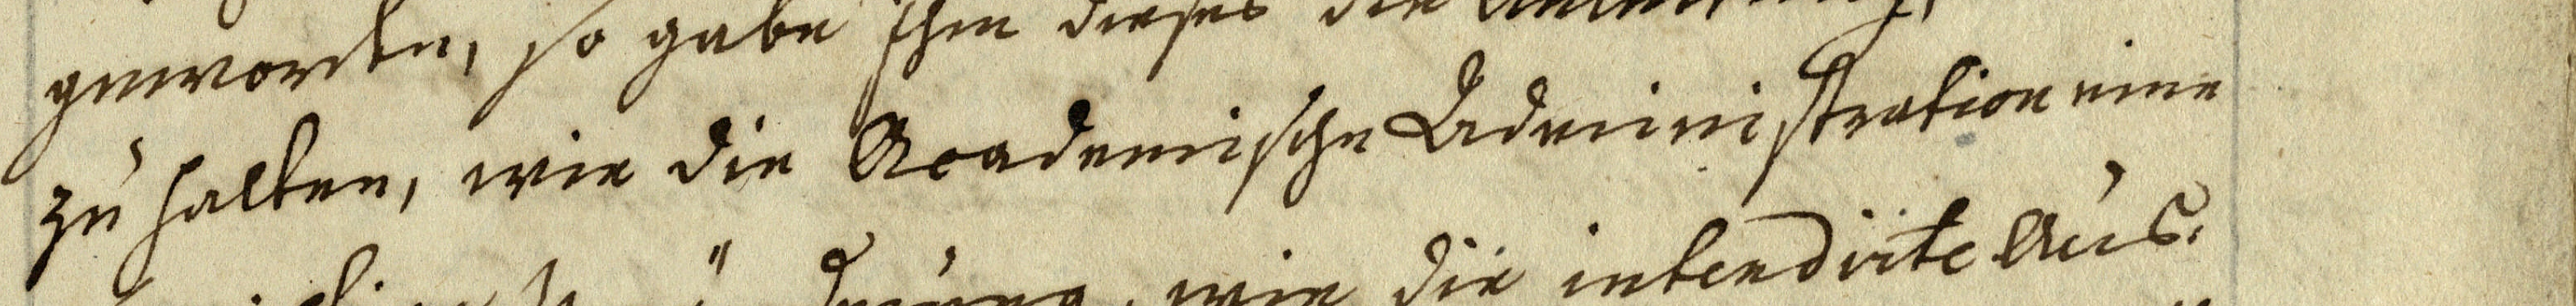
zu halten, wie die Academische Administration eine
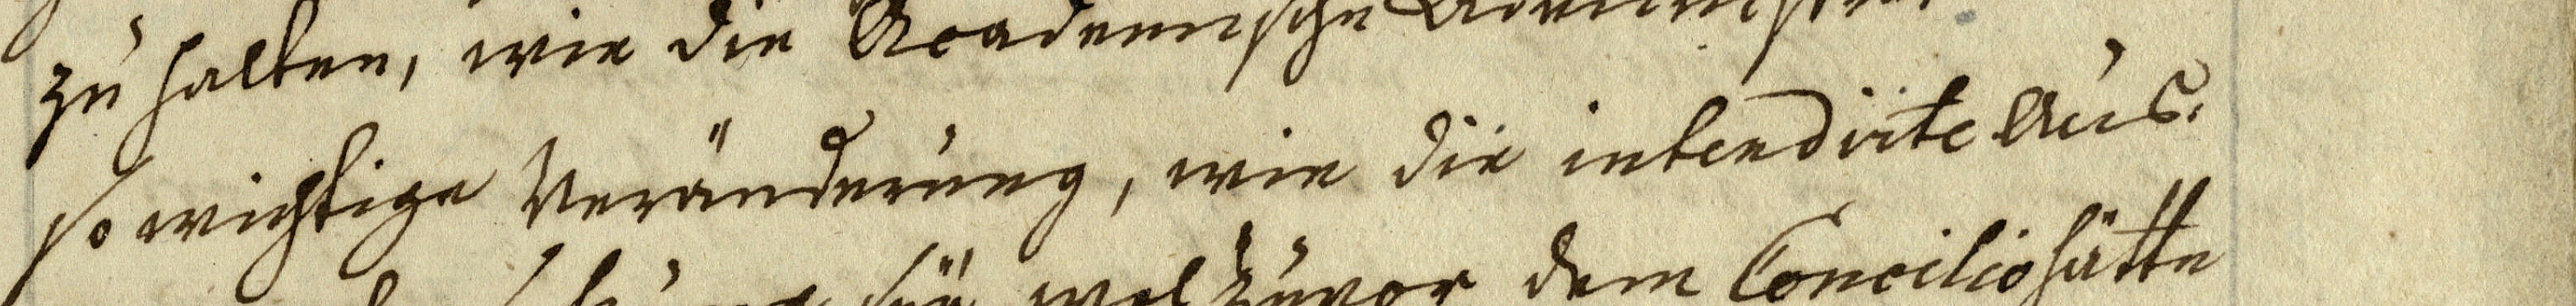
so wichtige Veränderung, wie die intendirte Aus¬
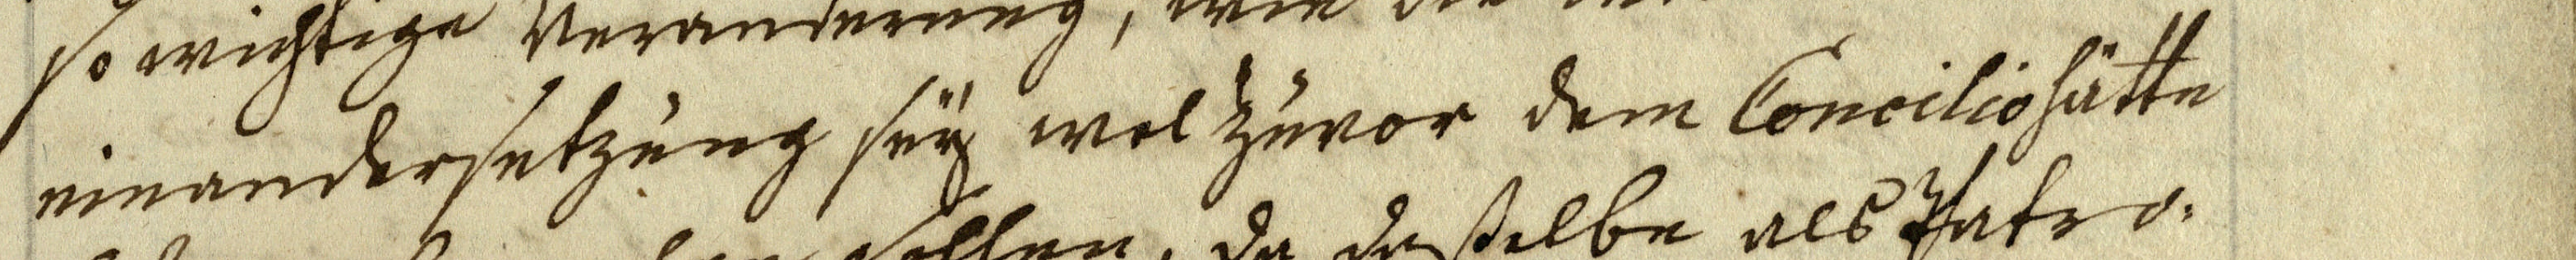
einandersetzung seÿ wol zuvor dem Concilio hätte
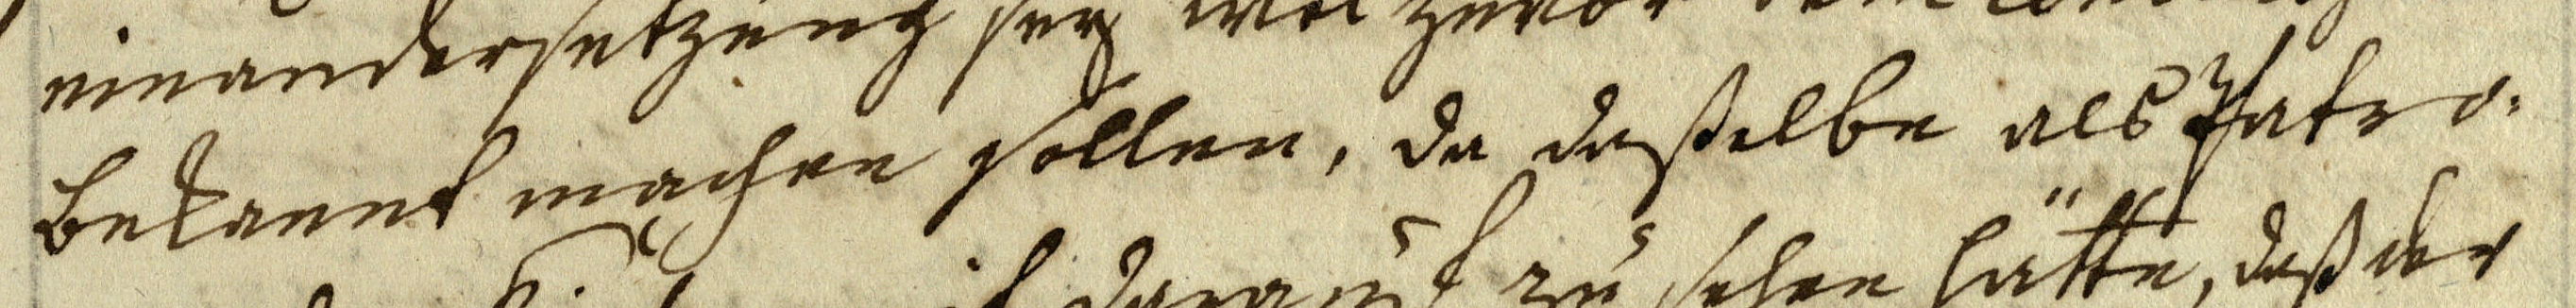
bekannt machen sollen, da daßelbe als Patro¬
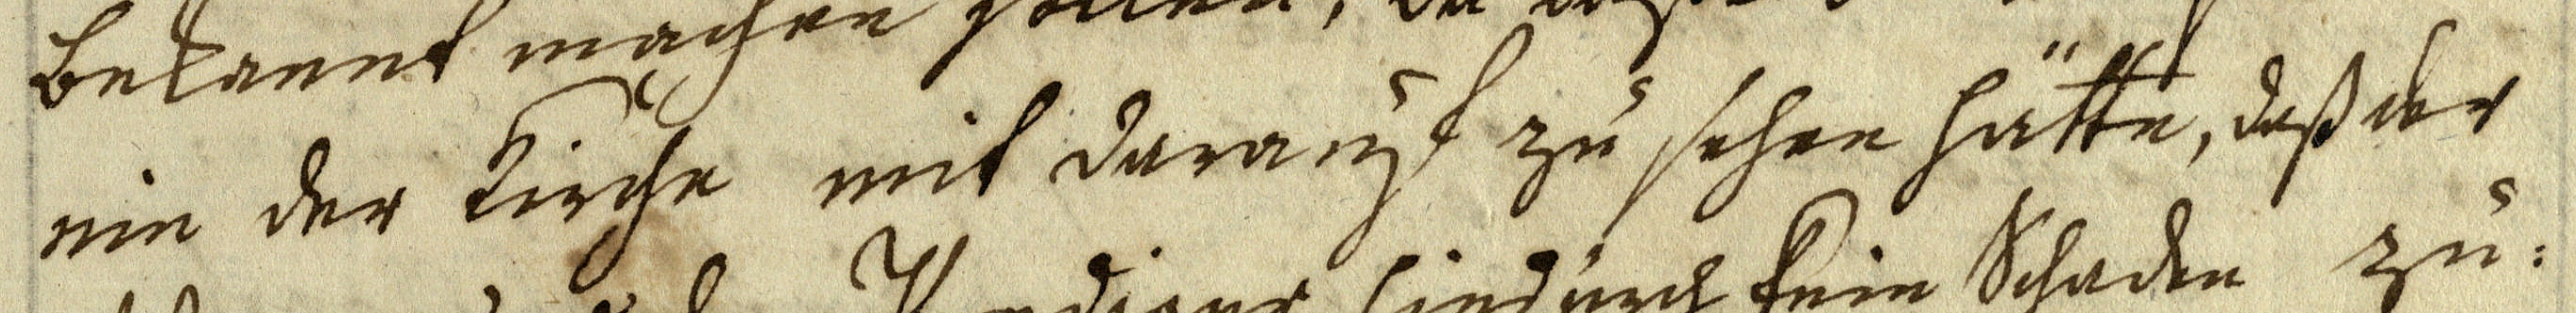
nin der Kirche mit darauf zu sehen hätte, daß der
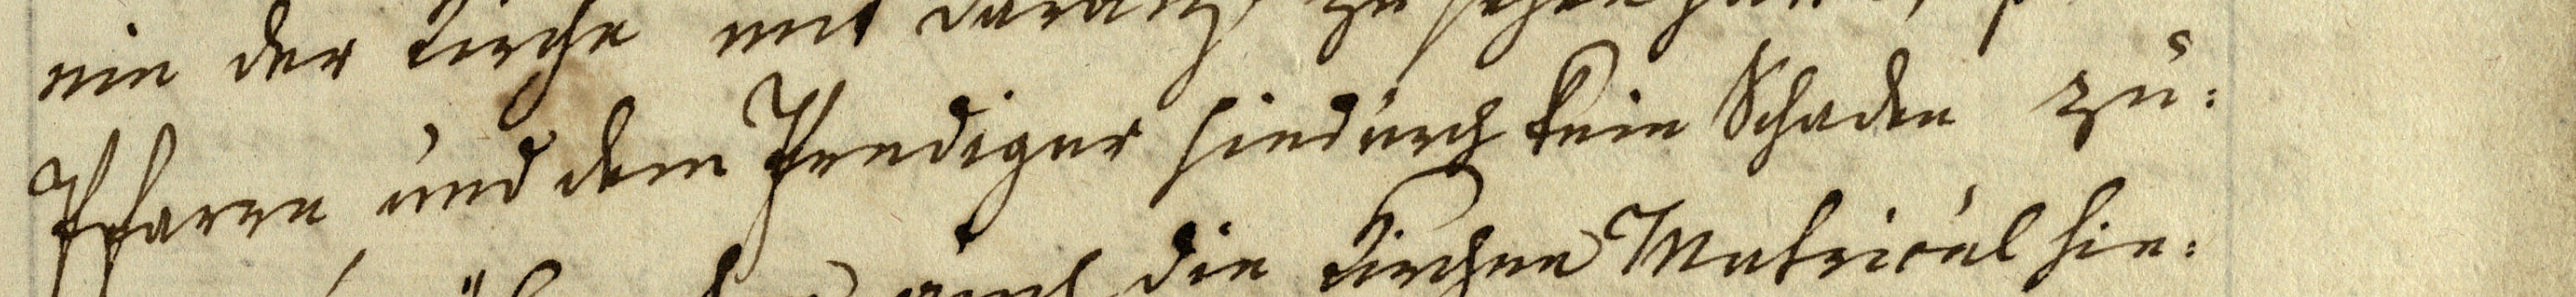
Pfarre und dem Prediger hiedurch kein Schaden zu¬
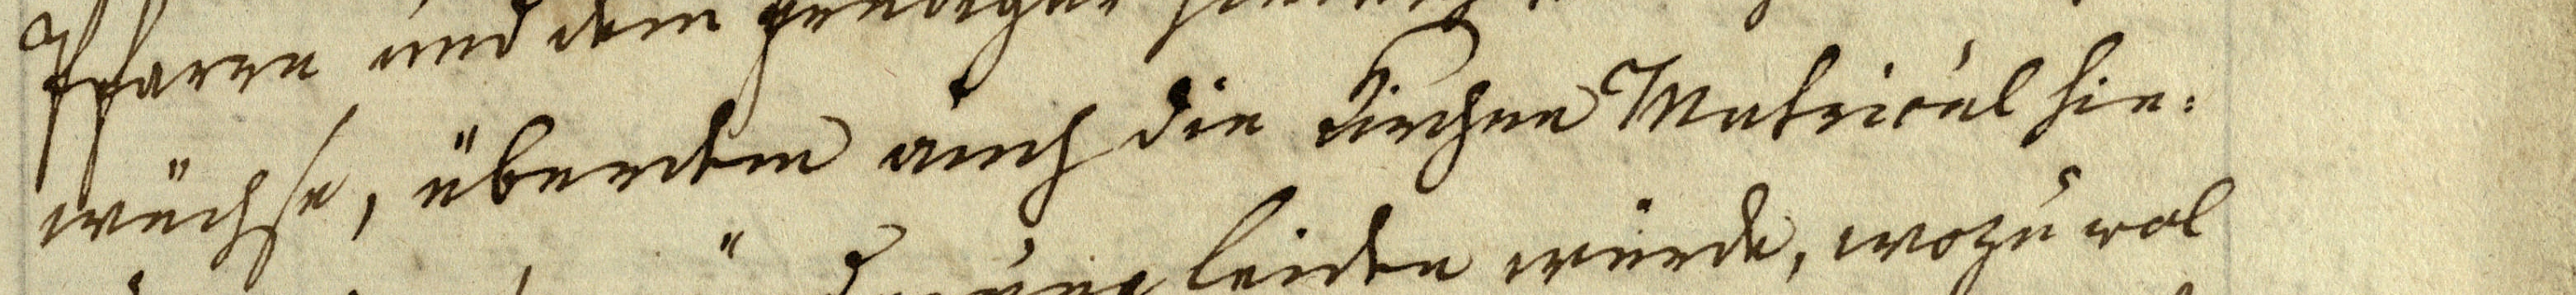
wüchse, überdem auch die Kirchen Matricul hie¬
